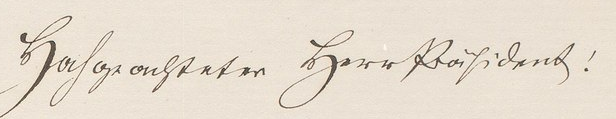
Hochgeachteter Herr Präsident!
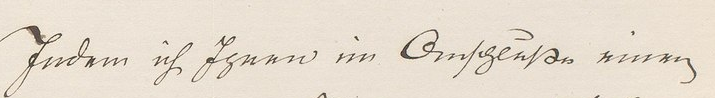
Indem ich Ihnen im Anschluße einen
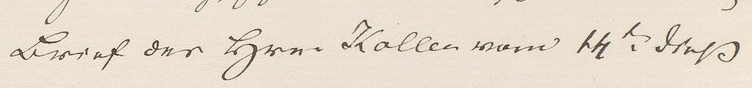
Brief des Hrn. Koller vom 14ten dieß
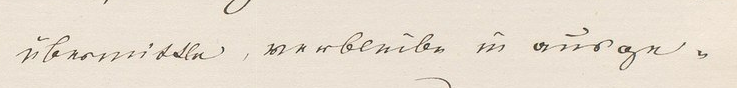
übermittle, verbleibe in ausge-
